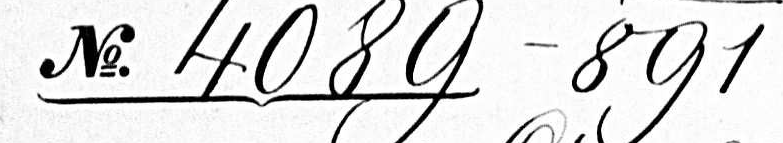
No 4089– 1891
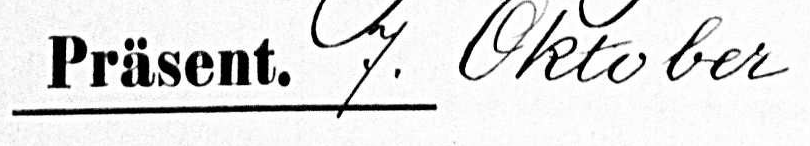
Präsent. – 7. Oktober
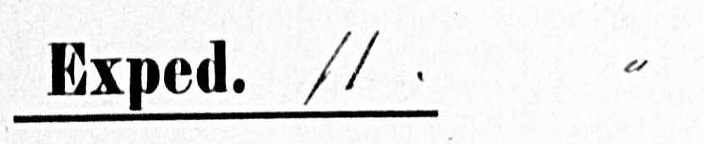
Exped. – 11. „
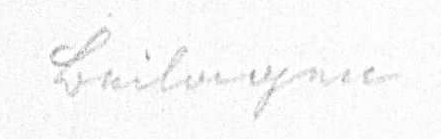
Beilagen
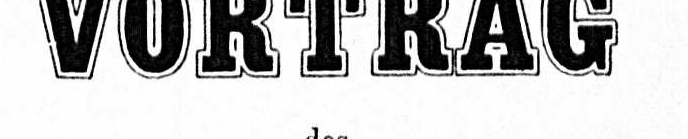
VORTRAG
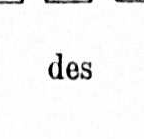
des
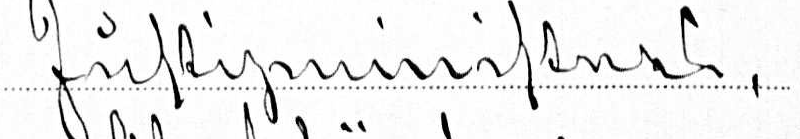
Justizministers,
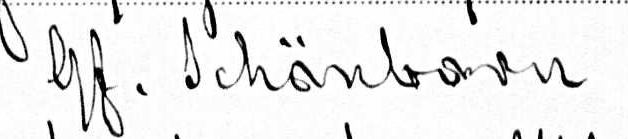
Gf. Schönborn
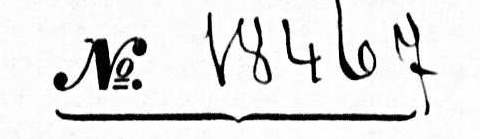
No. 18467
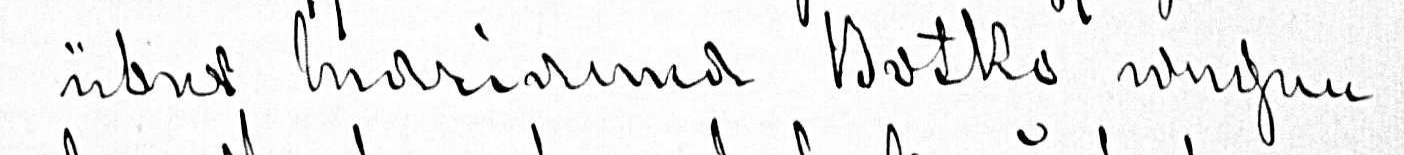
über Marianna Botko wegen
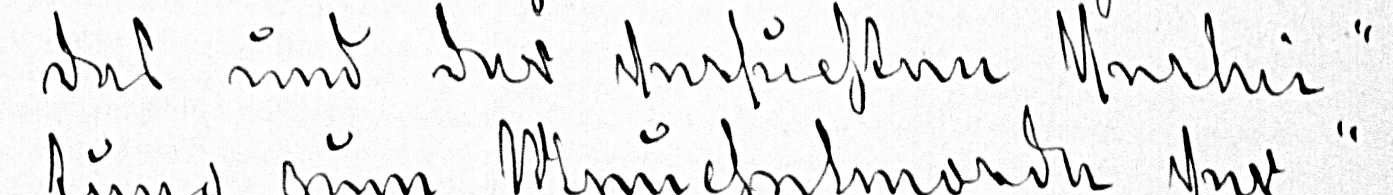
des und der versuchten Verlei¬
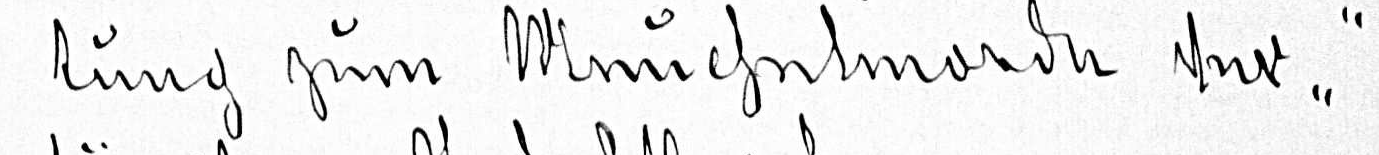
tung zum Meuchelmorde ver¬
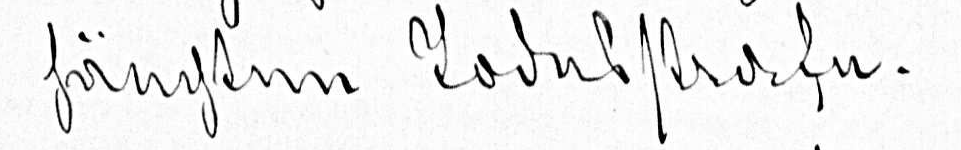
hängten Todesstrafe.
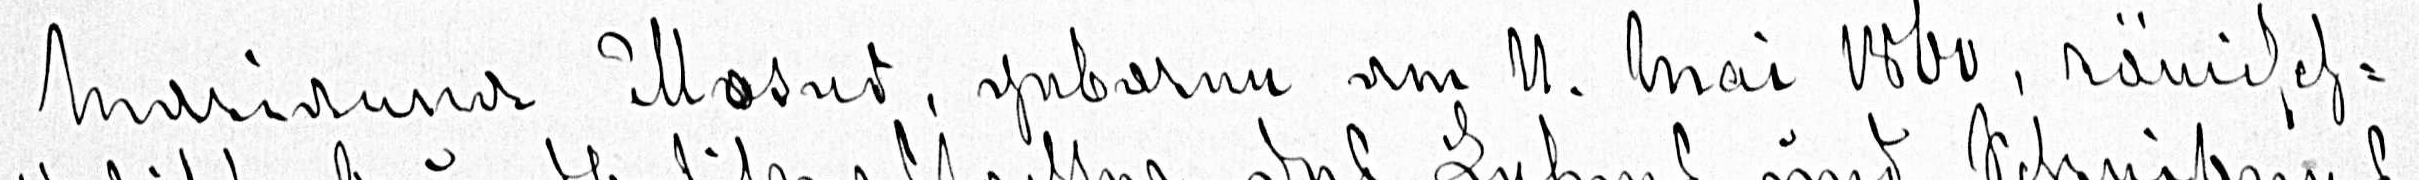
Marianna Mosur, geboren am 11. Mai 1860, römisch¬
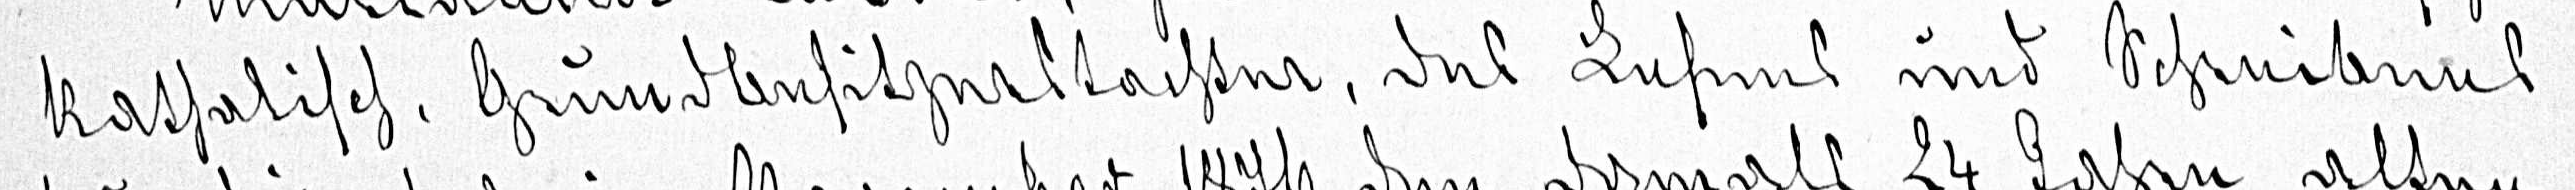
katholisch, Grudnbesitzerstochter, des Lesens und Schreiben
